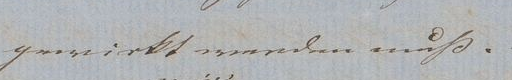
gewirkt werden muß. –
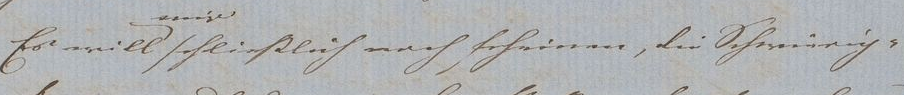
Es will mir schließlich noch scheinen, die Schwierig-
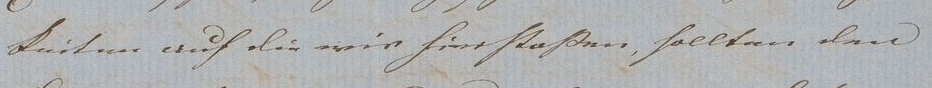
keiten auf die wir hier stoßen, sollten den
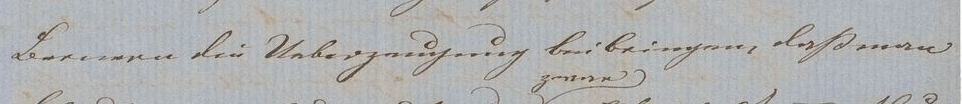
Bernern die Ueberzeugung beibringen, daß man
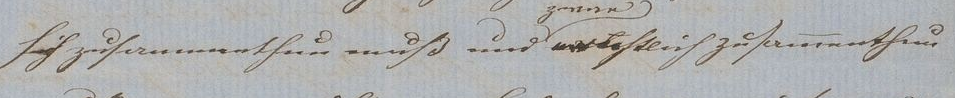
sich zusammenthun muß und zwar ernstlich zusammenthun
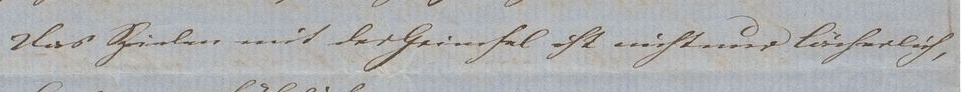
Das Spielen mit der Grimsel ist nicht nur lächerlich,
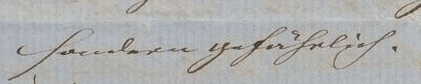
sondern gefährlich.
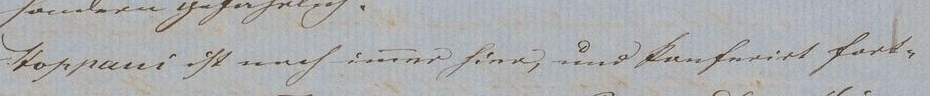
Stoppani ist noch immer hier, und konferirt fort-
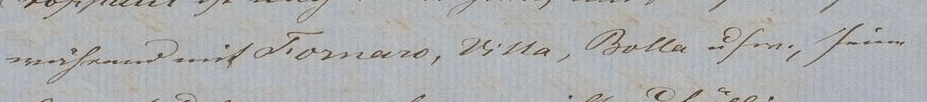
während mit Fornaro, Villa, Bolla usw., seine
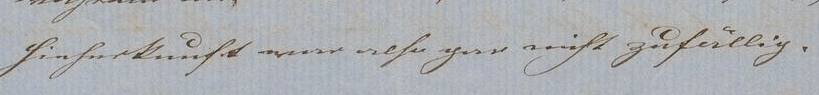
Hieherkunft war also gar nicht zufällig.
